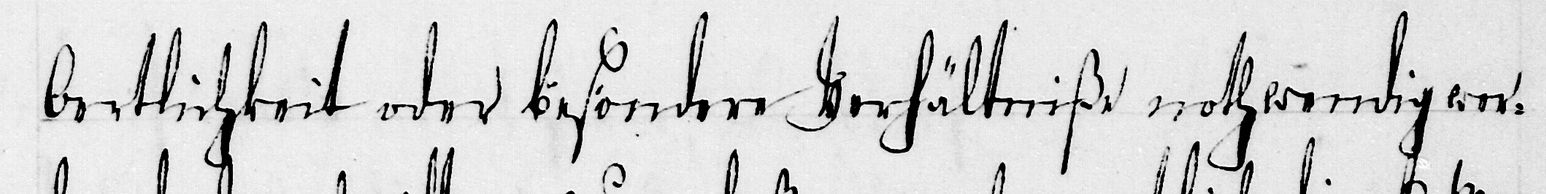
Oertlichkeit oder besondere Verhältniße nothwendig wer¬
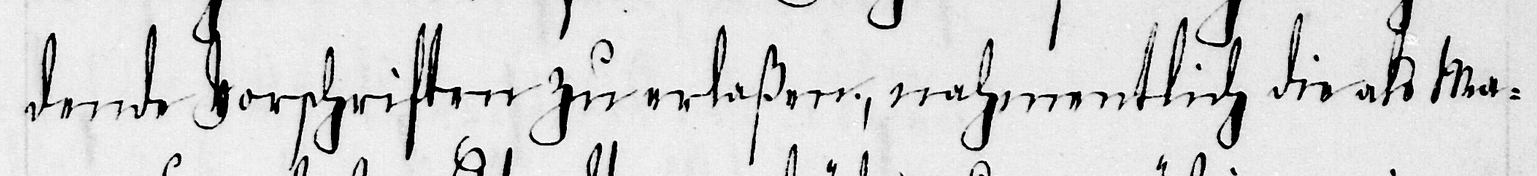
dende Vorschriften zu erlaßen, nahmentlich die als Ma¬
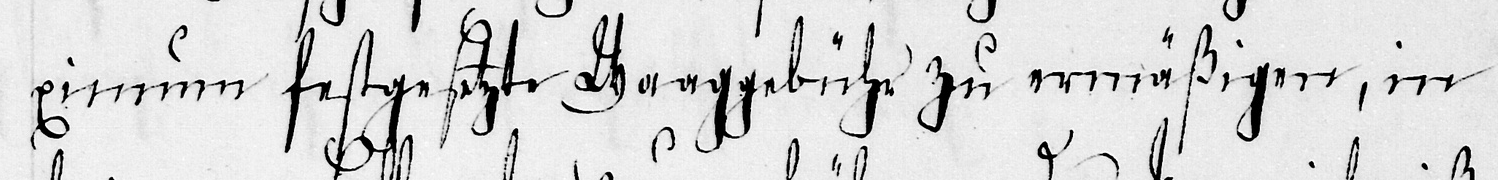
ximum festgesetzte Waaggebühr zu ermäßigen, in
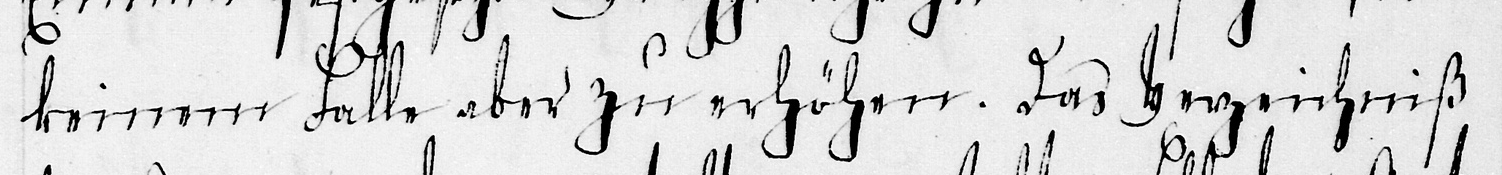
keinem Falle aber zu erhöhen. Das Verzeichniß
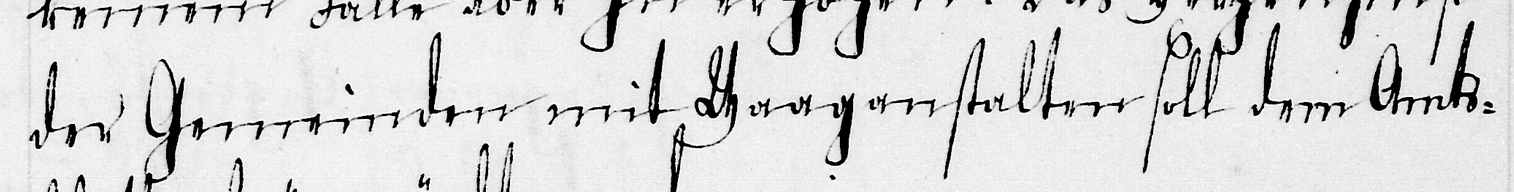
der Gemeinden mit Waaganstalten soll dem Amts¬
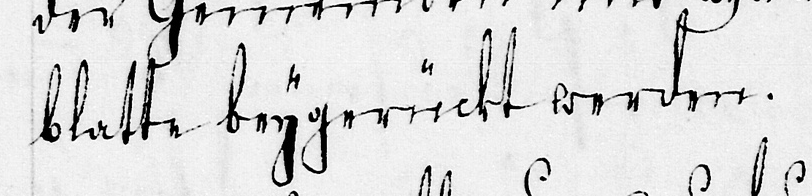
blatte beygerückt werden.
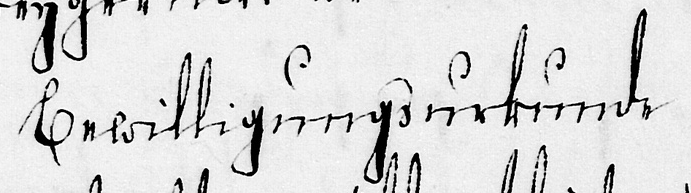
Bewilligungsurkunde
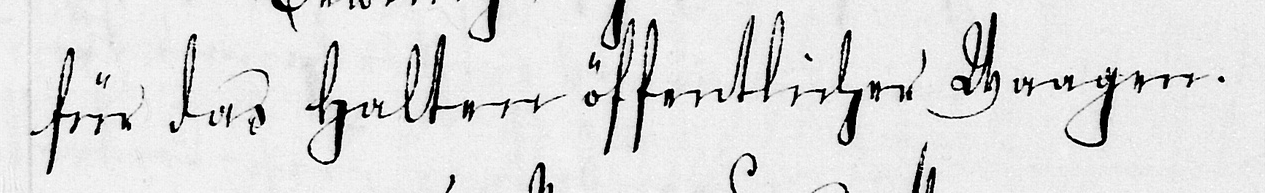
für das Halten öffentlicher Waagen.
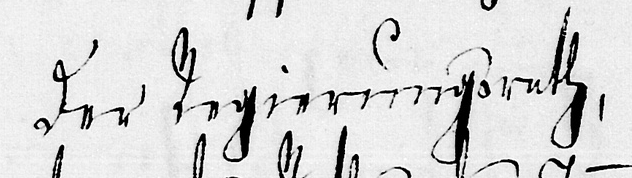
Der Regierungsrath,
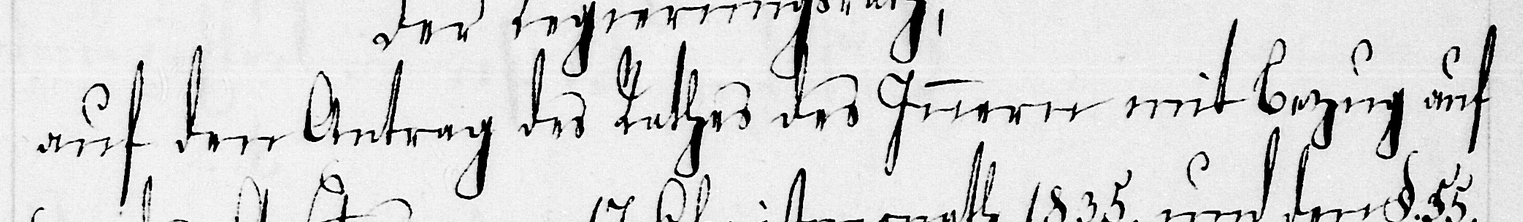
auf den Antrag des Rathes des Innern mit Bezug auf
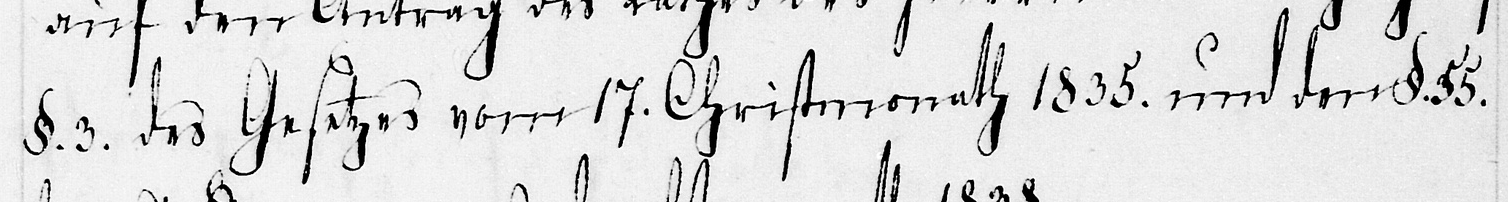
§. 3. des Gesetzes vom 17. Christmonath 1835. und den §.
